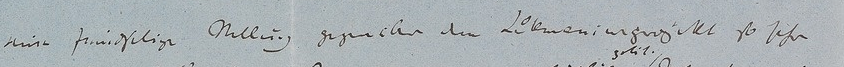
eine feindselige Stellung gegenüber dem Lukmanierprojekt so sehr
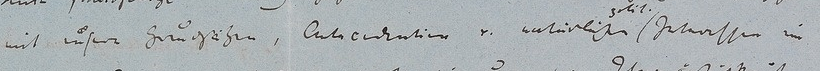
mit unsern Grundsätzen, Antecedentien &. natürlichen polit. Interessen im
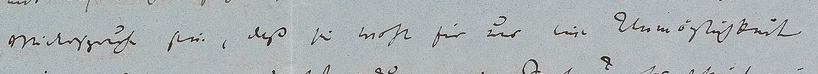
Widerspruch sein, daß sie wohl für uns eine Unmöglichkeit
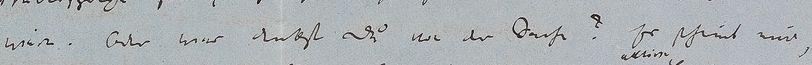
wäre. Oder was denkst Du von der Sache? Es scheint mir,
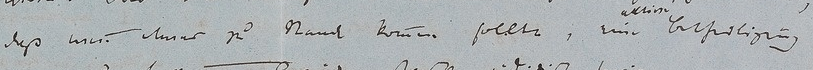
daß wenn etwas zu Stande kommen sollte, eine aktive Betheiligung
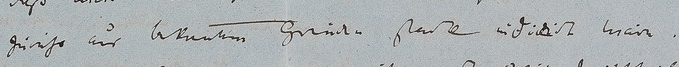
Zürichs aus bekanntem Gründen stark indicirt wäre.
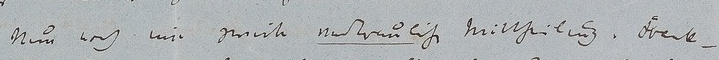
Nun noch eine zweite vertrauliche Mittheilung. Frank-
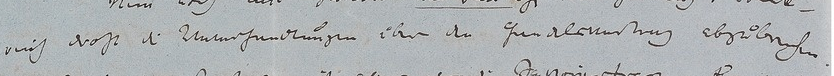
reich droht die Unterhandlungen über den Handelsvertrag abzubrechen.
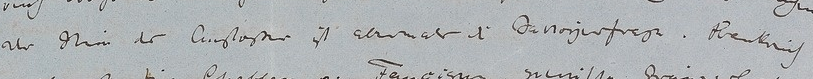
Der Stein des Anstoßes ist abermals die Savoyerfrage. Frankreich
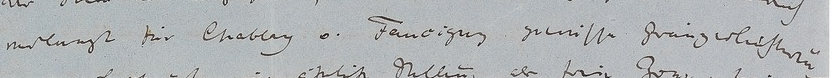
verlangt für Chablay &. Faucigny gewisse Gränzerleichterun-
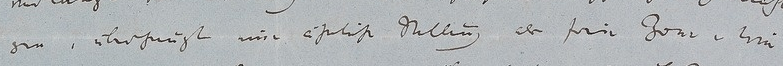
gen, überhaupt eine ähnliche Stellung als freie Zone, wie
